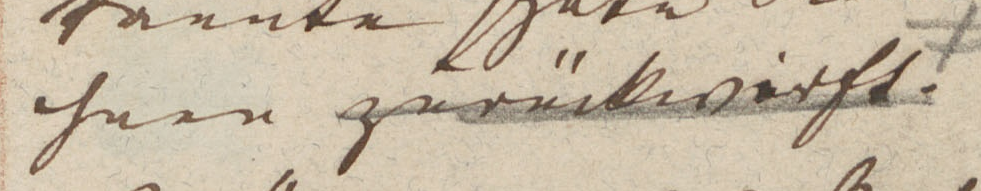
ihnen zurückwirft. %
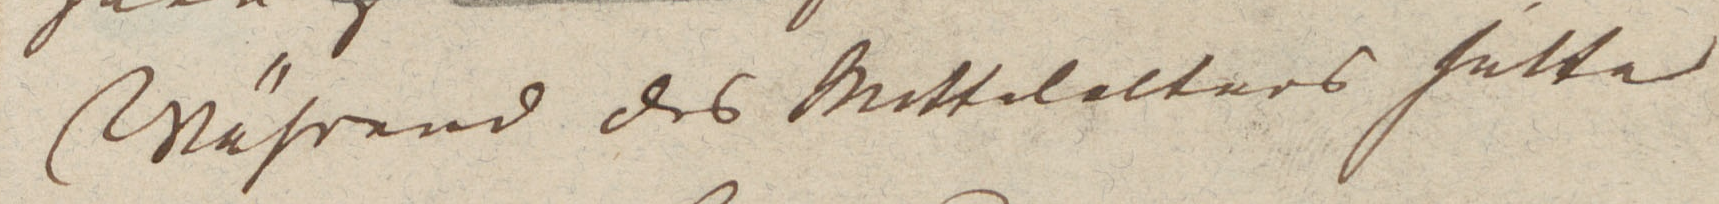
Während des Mittelalters hatte
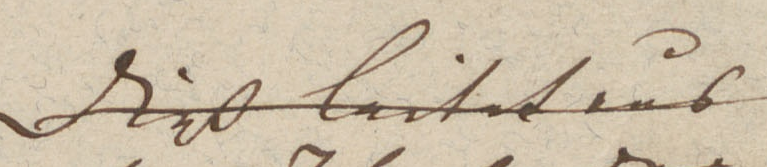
Diess leitet uns
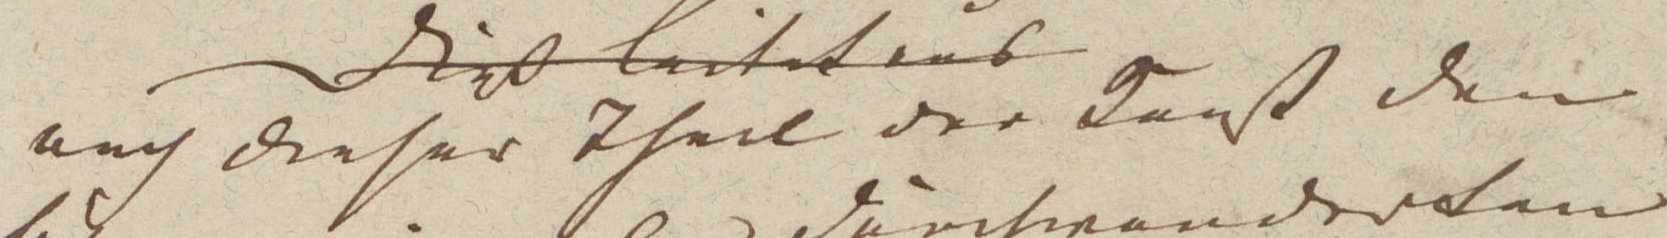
auch dieser Theil der Kunst den
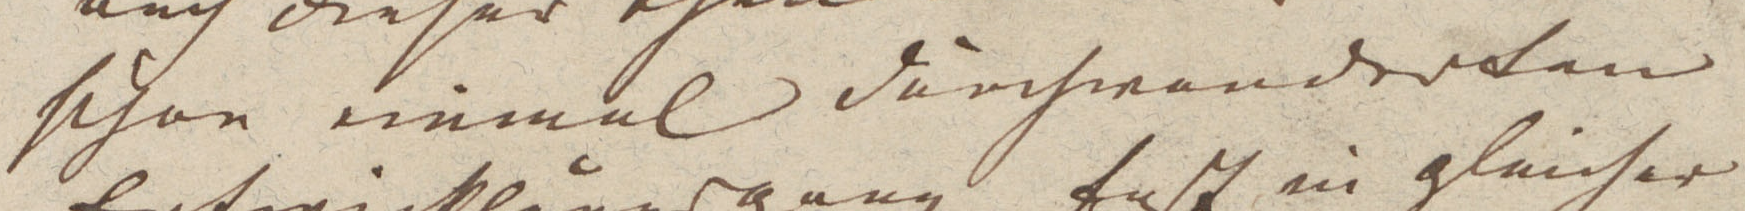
schon einmal durchwanderten
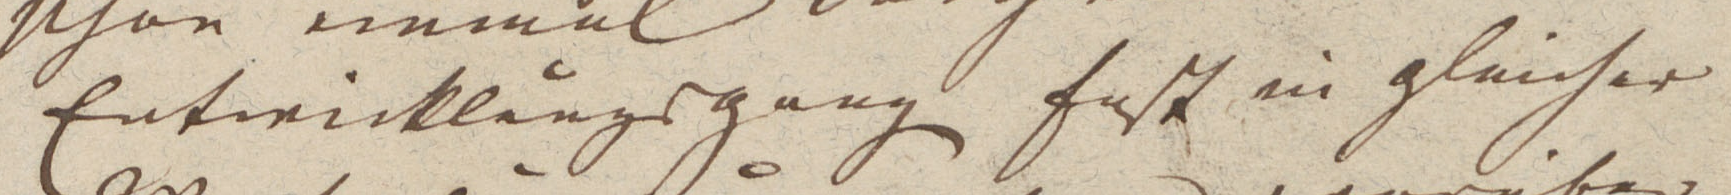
Entwicklungsgang fast in gleicher
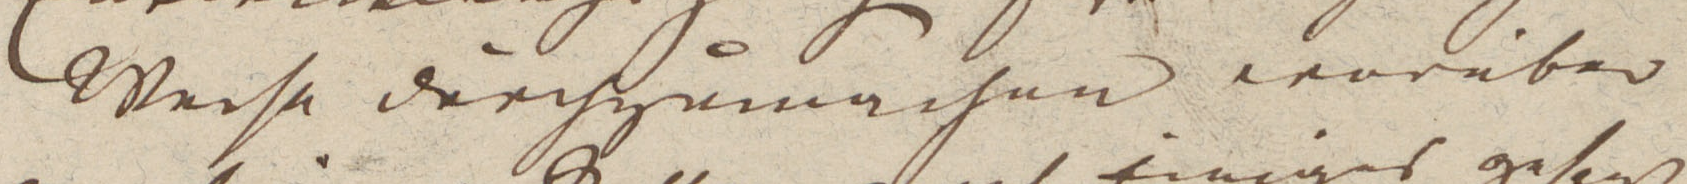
Weise durchzumachen worüber
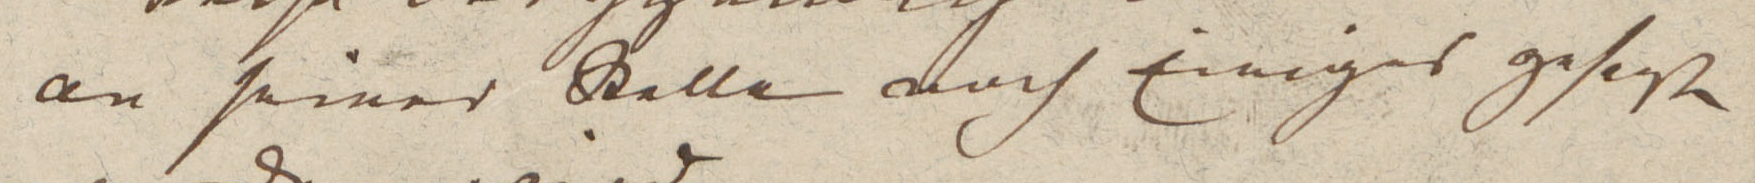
an seiner Stelle noch Einiges gesagt
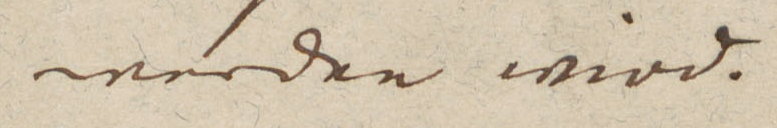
werden wird.
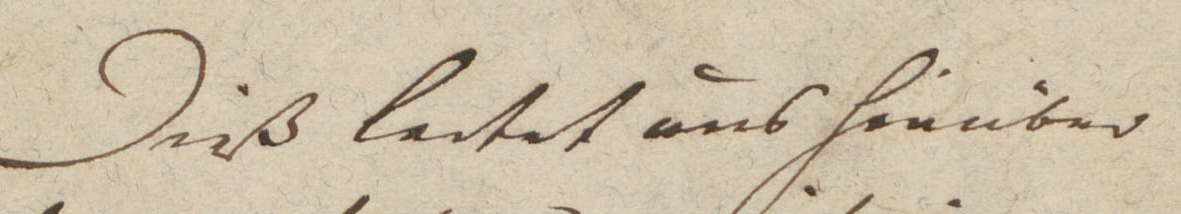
Diess leitet uns hinüber
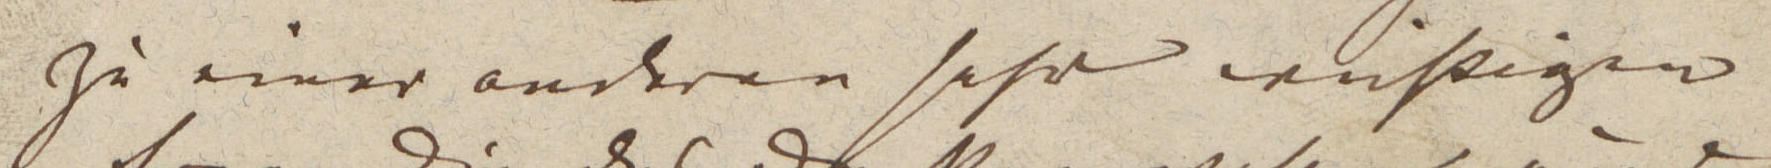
zu einer anderen sehr wichtigen
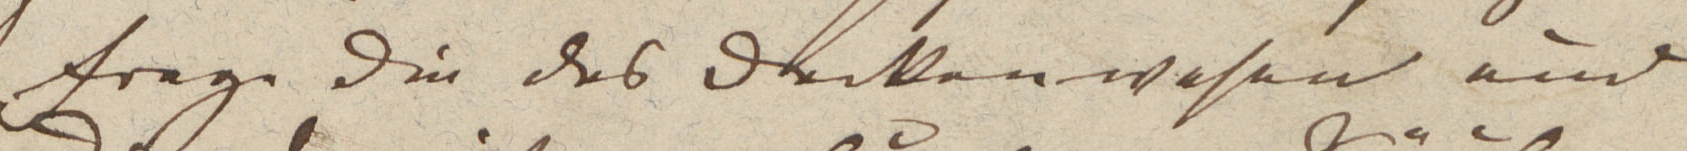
Frage die das Deckenwesen und
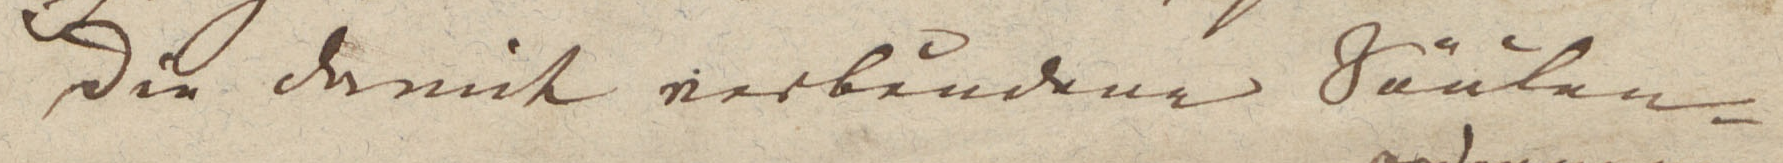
die damit verbundene Säulen-
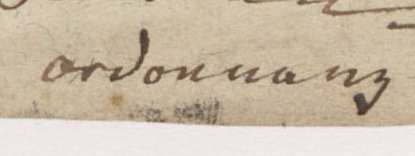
ordonnanz
